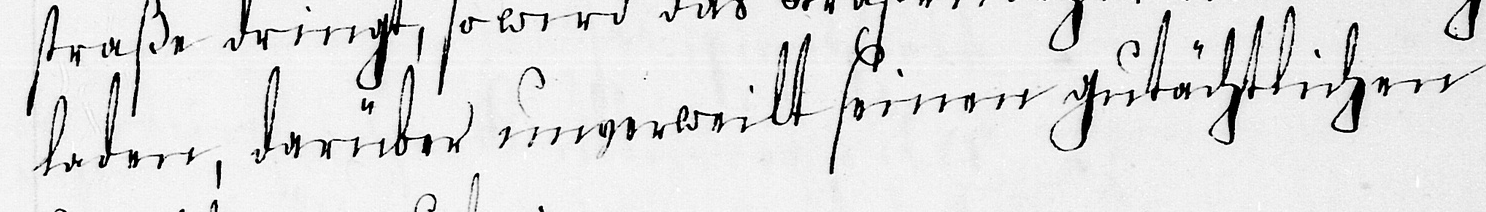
laden, darüber unverweilt seinen gutächtlichen
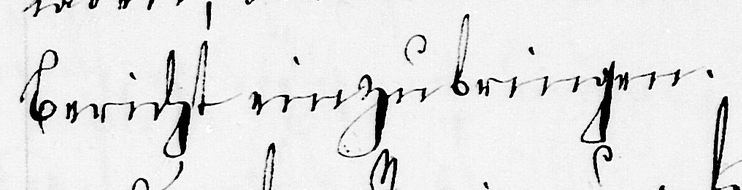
Bericht einzubringen.
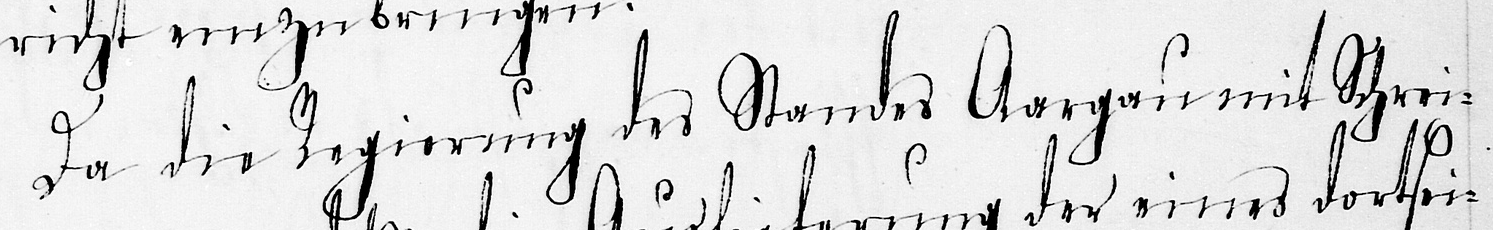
Da die Regierung des Standes Aargau mit Schrei¬
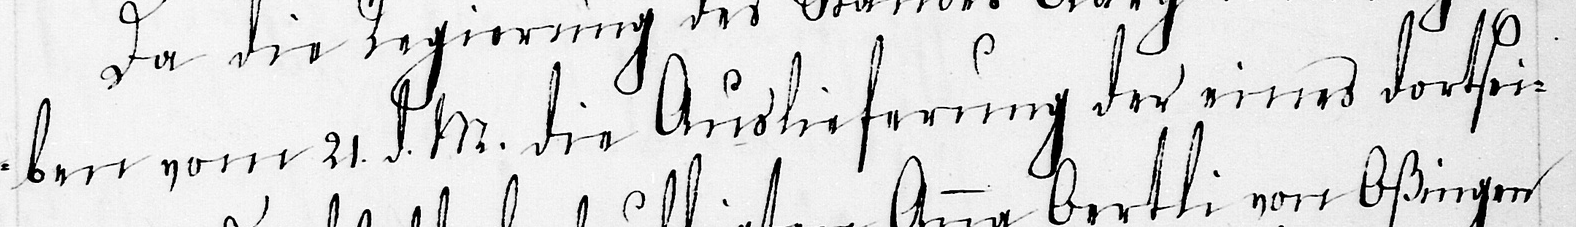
ben vom 21. d. M. die Auslieferung der eines dortsei¬
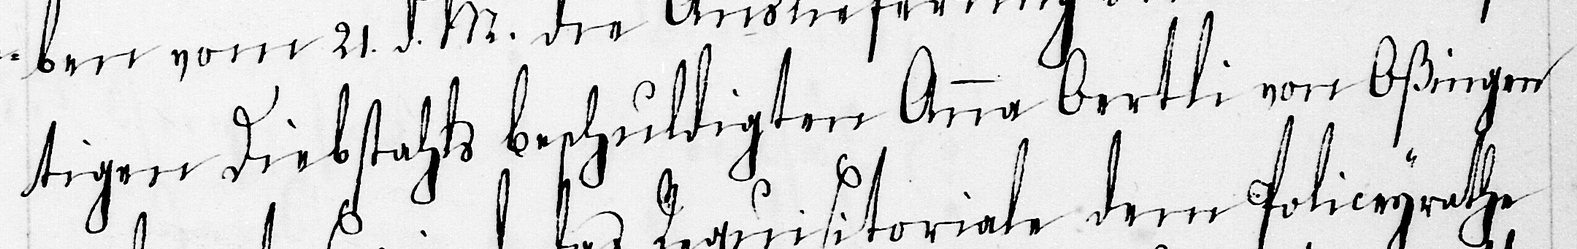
tigen Diebstahls beschuldigten Anna Oertli von Oßingen
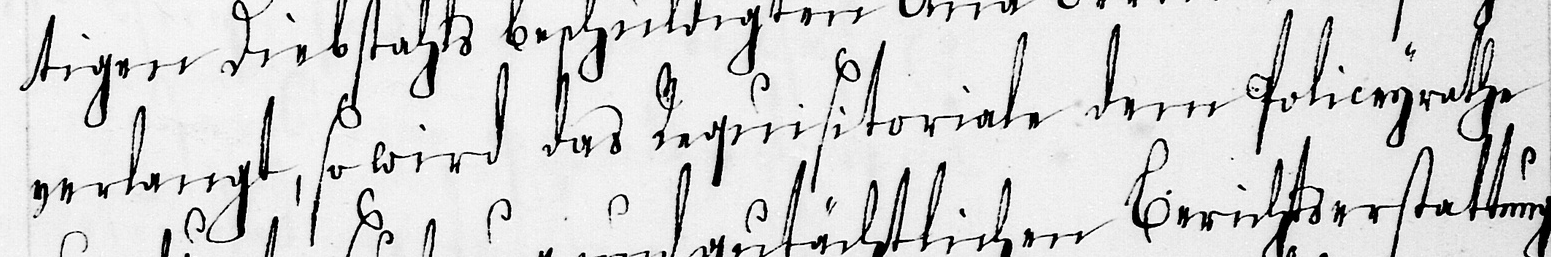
verlangt, so wird das Requisitoriale dem Policeyrathe
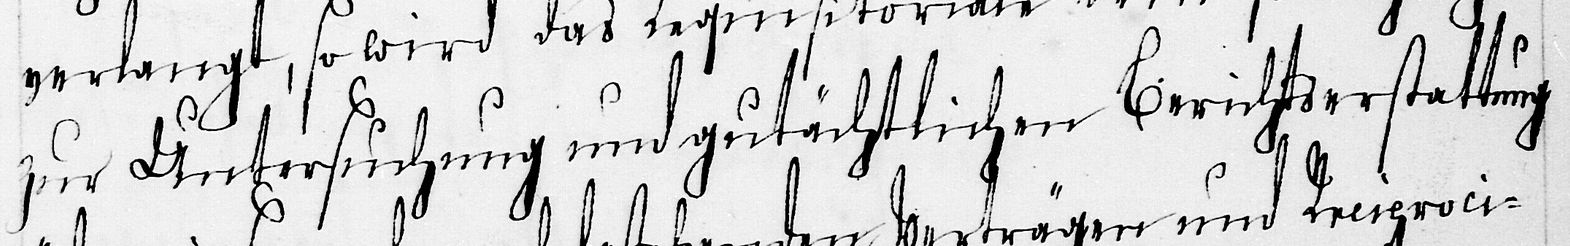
zur Untersuchung und gutächtlichen Berichterstattung
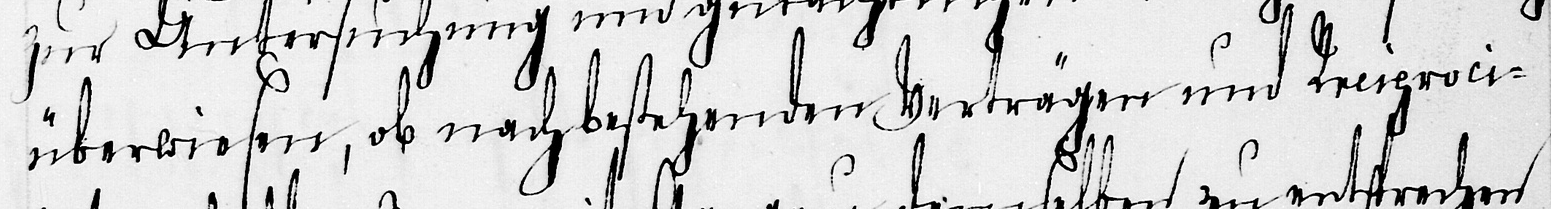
überwiesen, ob nach bestehenden Verträgen und Reciproci¬
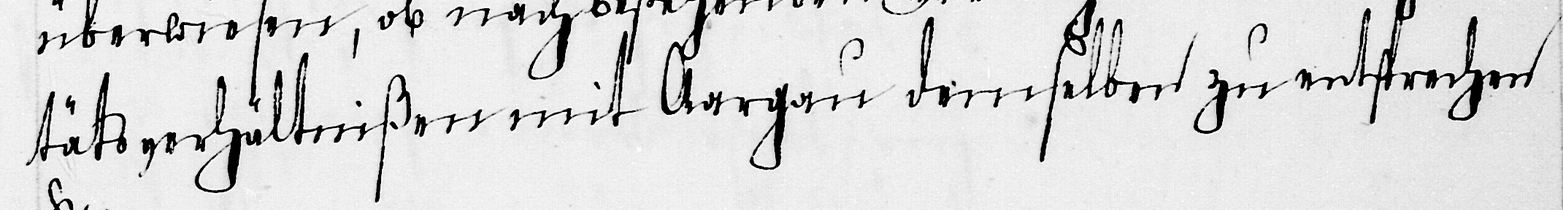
tätsverhältnißen mit Aargau demselben zu entsprechen
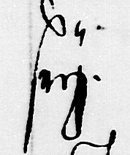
sey.
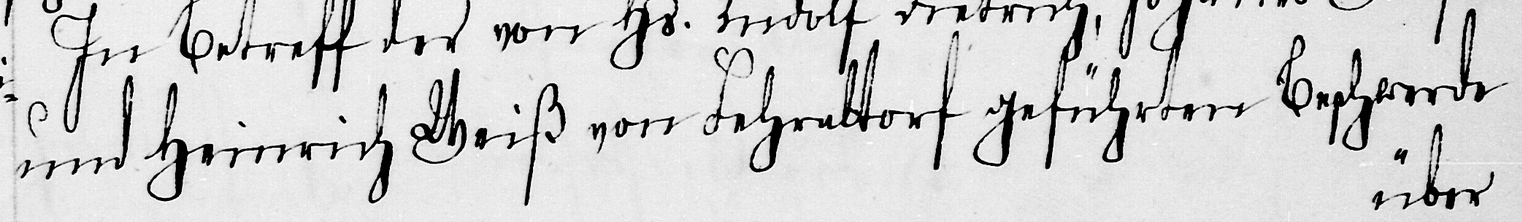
und Heinrich Weiß von Fehraltorf geführten Beschwerde
